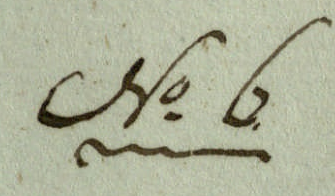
Nº 6.
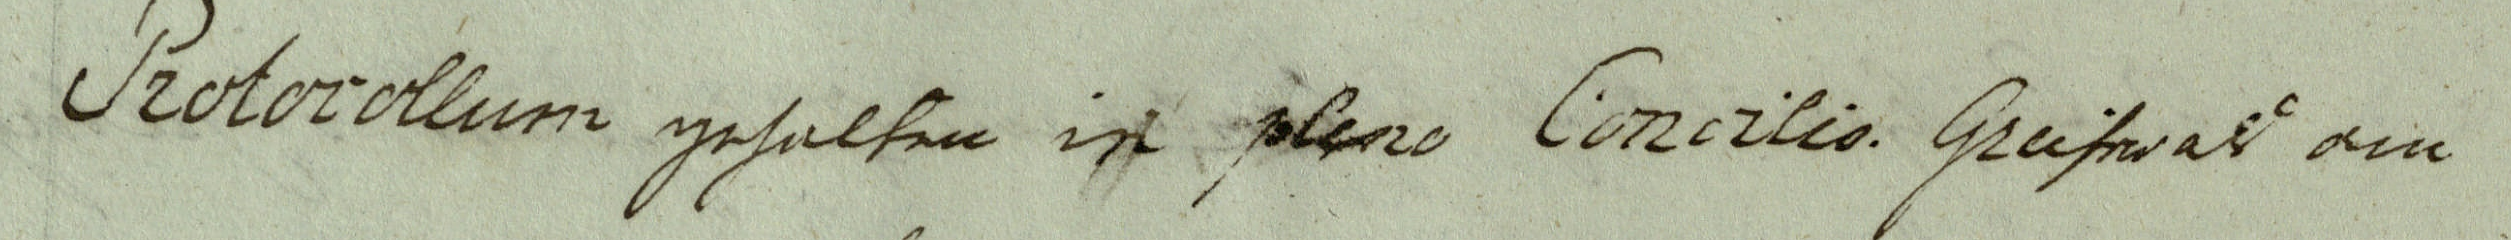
Protocollum gehalten in pleno Concilio. Greifswald am
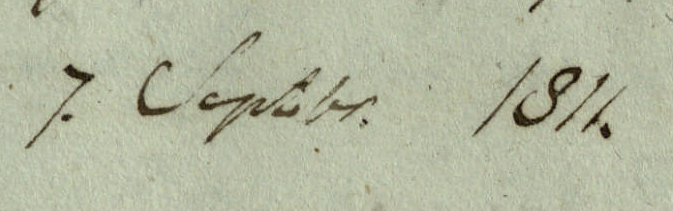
7. Septbr. 1811.
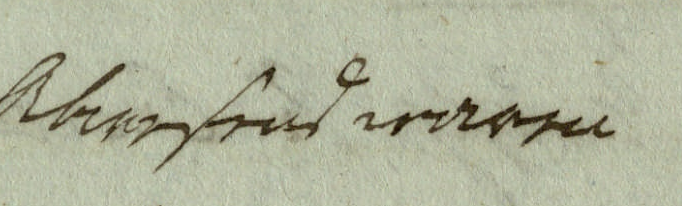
Abwesend waren
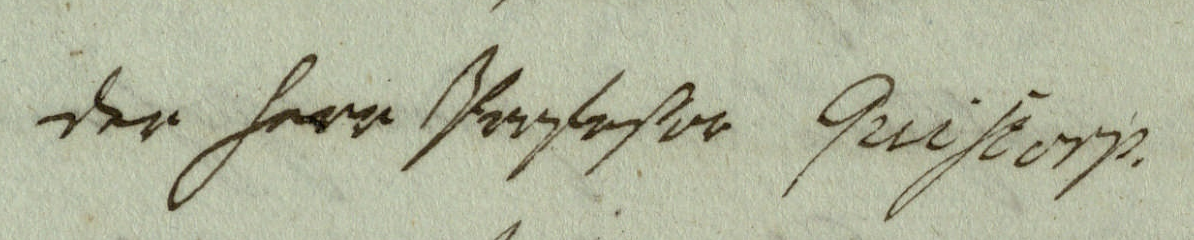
der herr Professor Quistorp.
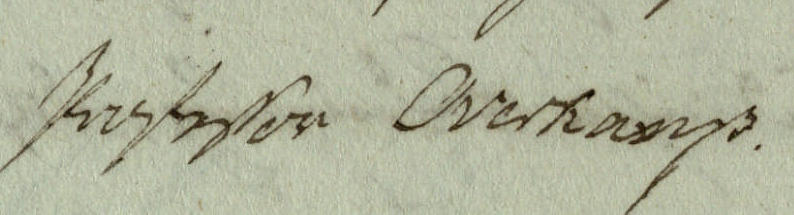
Professor Overkamp.
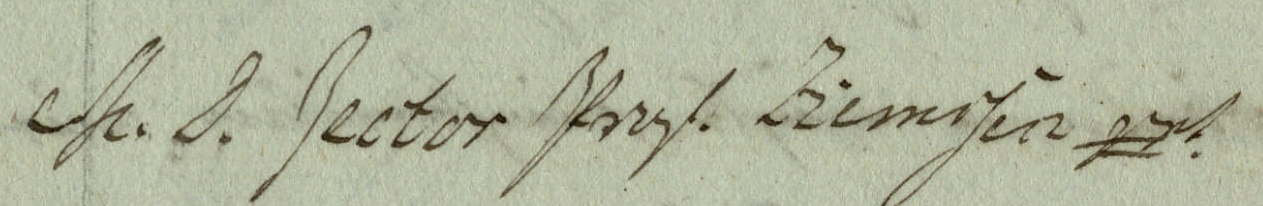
M. D. Rector Prof. Ziemssen ppt.
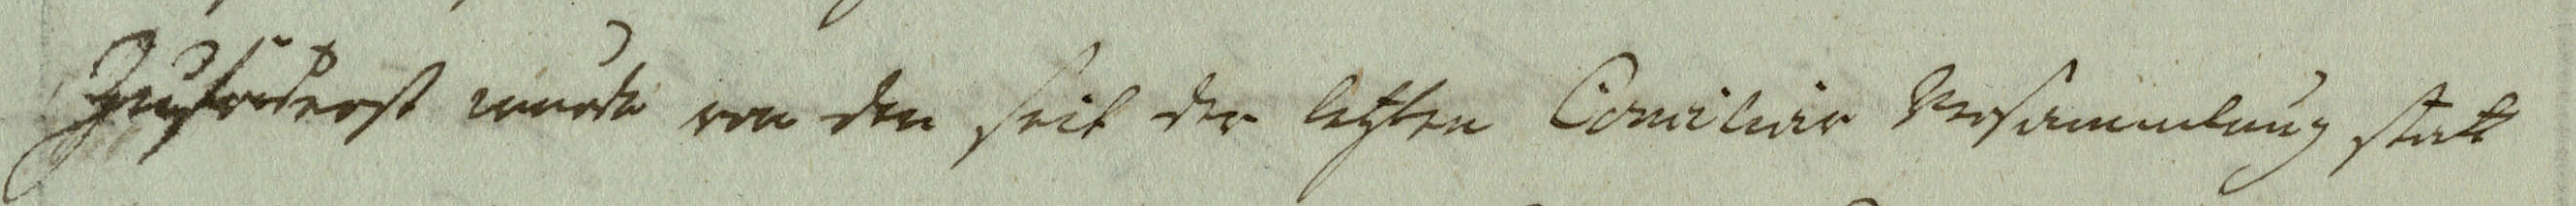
Zuförderst wurde von den seit der letzten Conciliar Versammlung statt
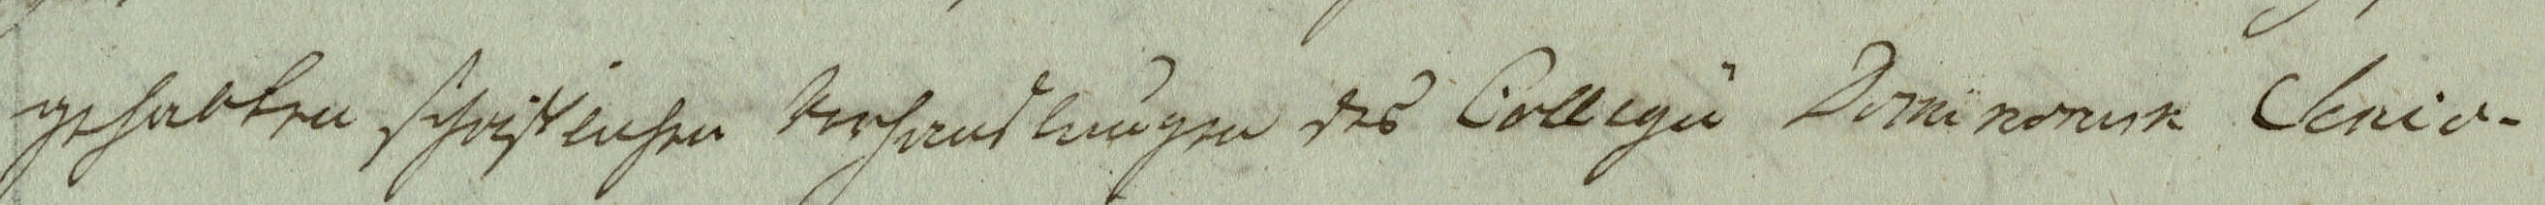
gehabten schriftlichen Verhandlungen des Collegii Dominorum Senio¬
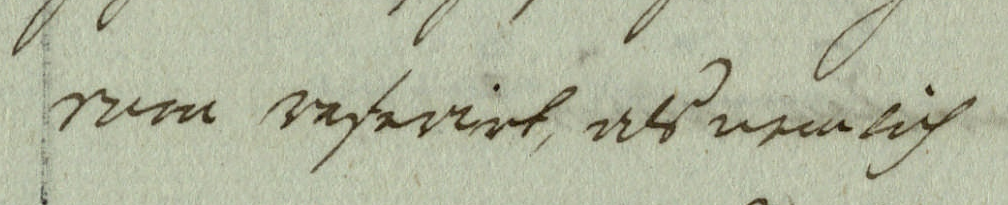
rum referirt, als nemlich
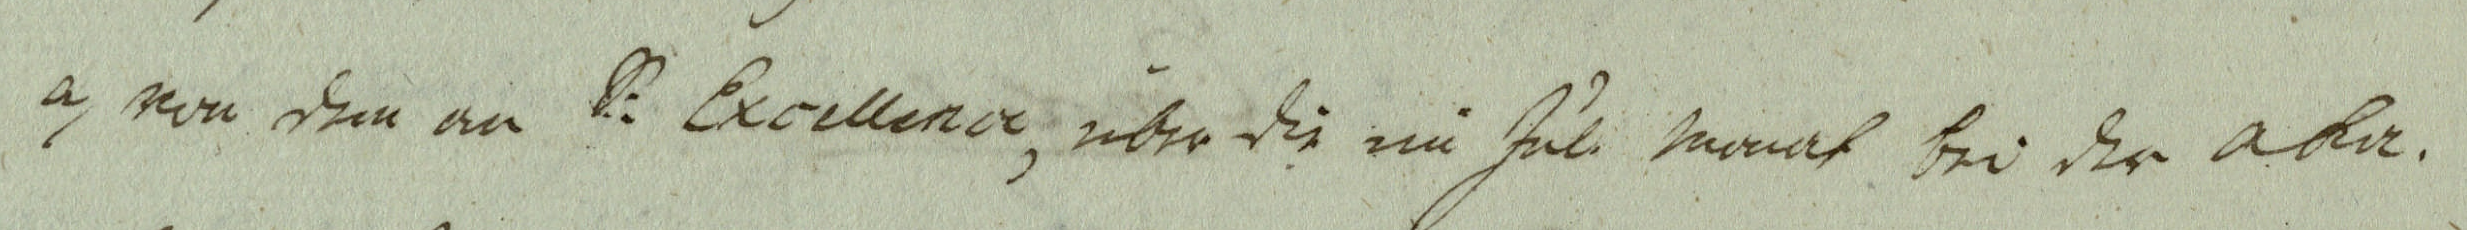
a, von dem an Sr. Excellence, über die im Jul. Monat bei der aka¬
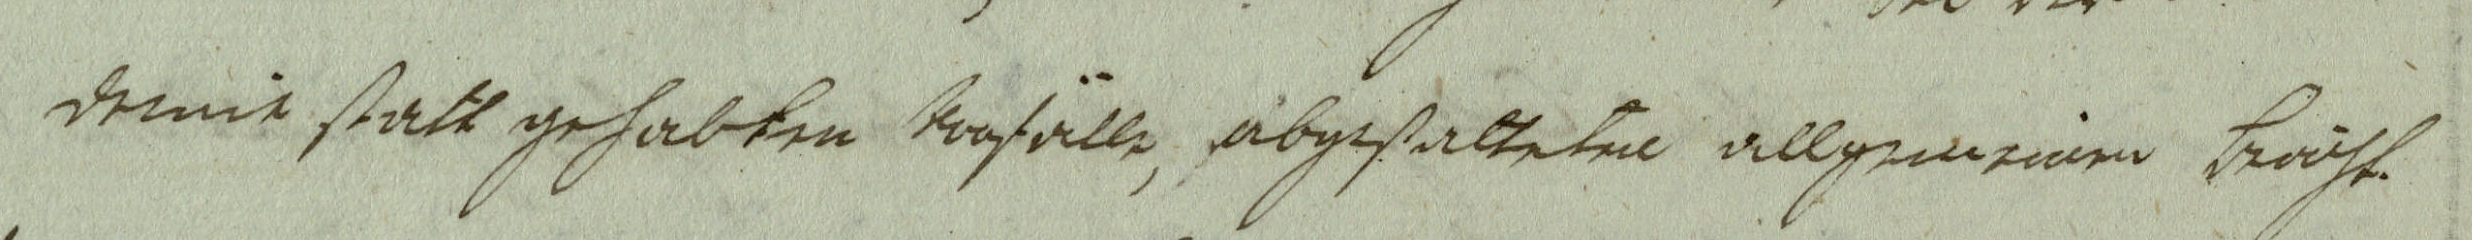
demie statt gehabten Vorfälle, abgestatteten allgemeinen Bericht.
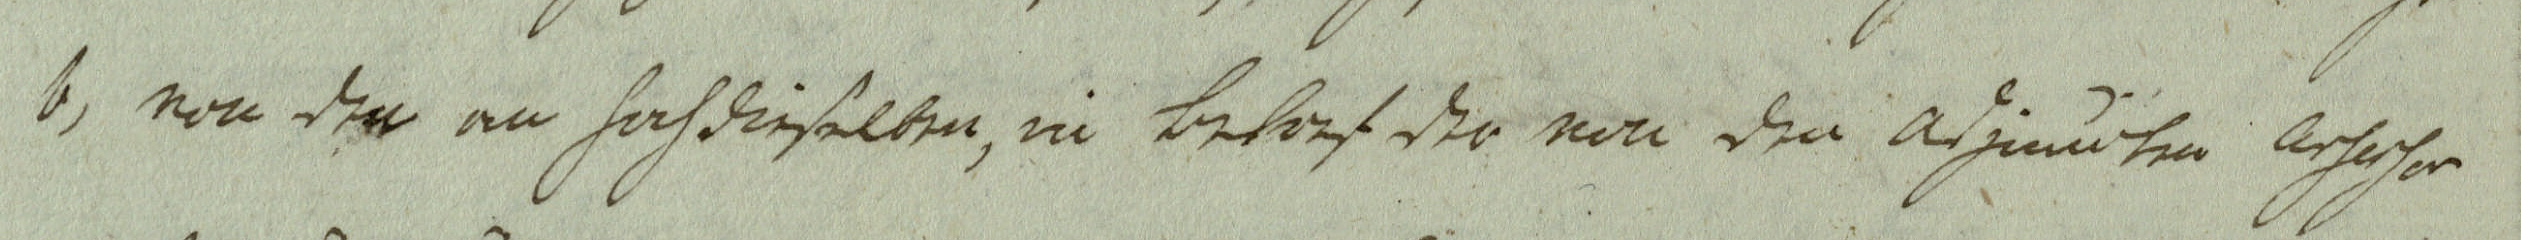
b, von den an hochdieselben, in Betref der von den Adjuncten Assessor
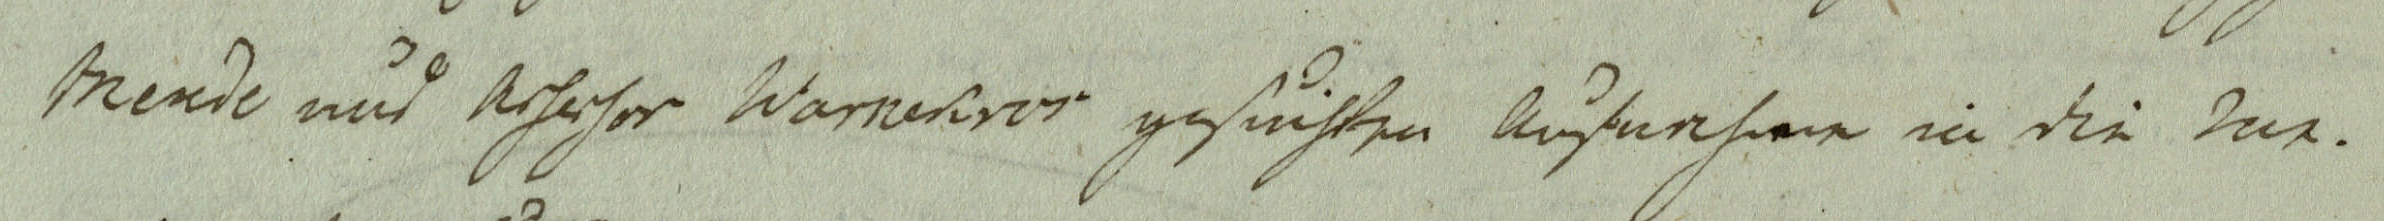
Mende und Assessor Warnekros gesuchten Aufnahme in die Me¬
